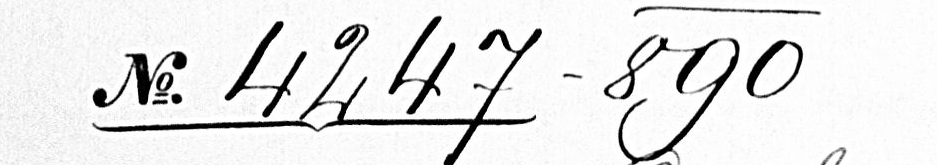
N° 4247-890
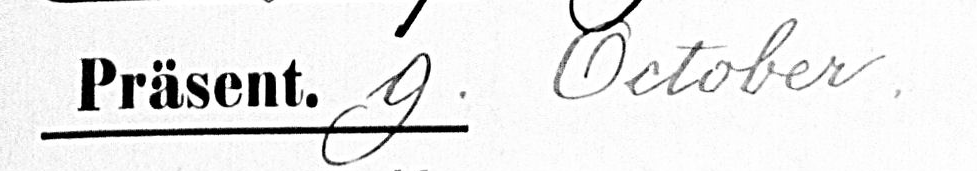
Präsent. 9. October.
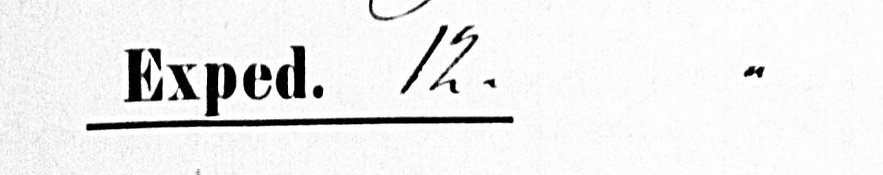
Exped. 12. October.
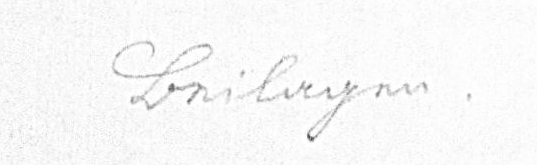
Beilagen.
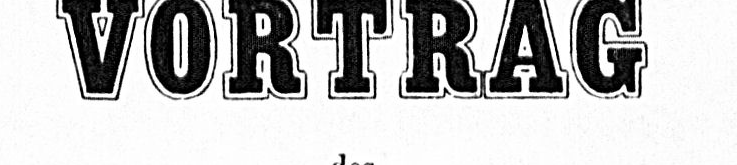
VORTRAG
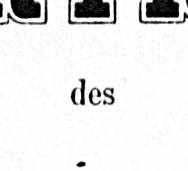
des
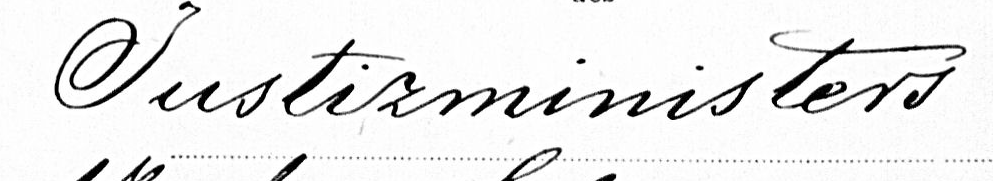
Justizministers
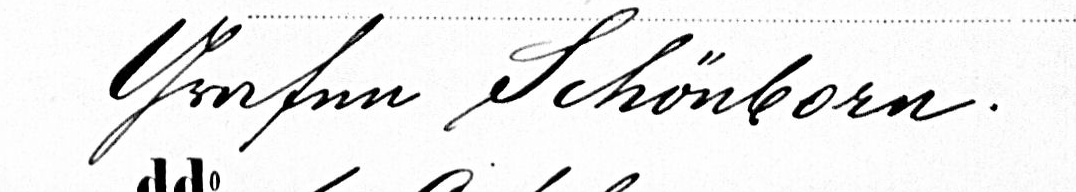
Grafen Schönborn.
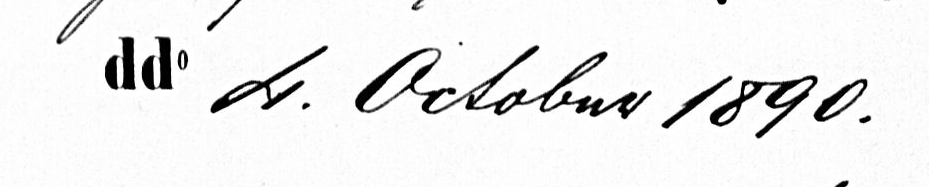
dd° 4. October 1890.
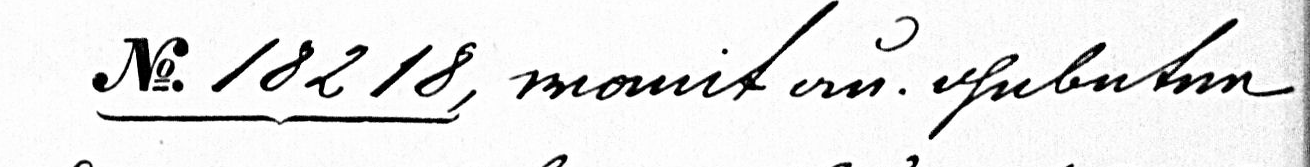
N° 18218, womit au. gebeten
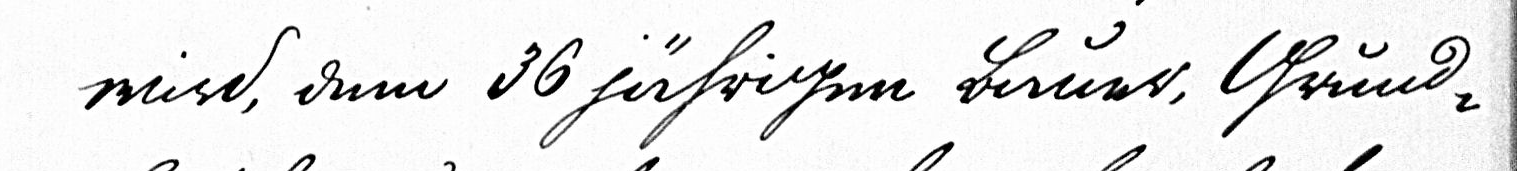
wird, dem 36 jährigen Bauer, Grund¬
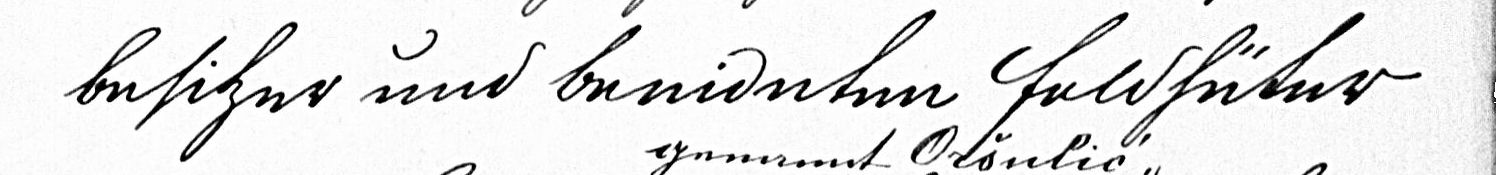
besitzer und beeideten Feldhüter
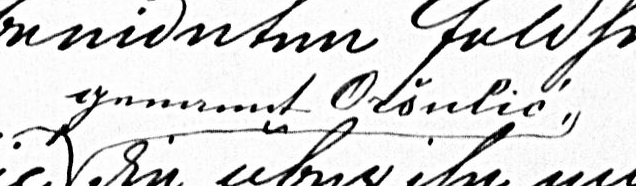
genannt Oršulić,
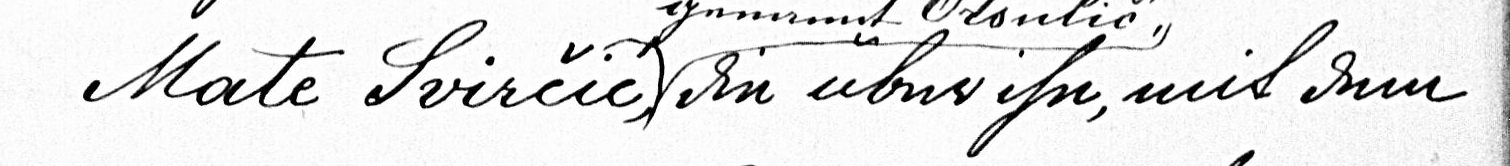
Mate Svirčic, die über ihn, mit dem
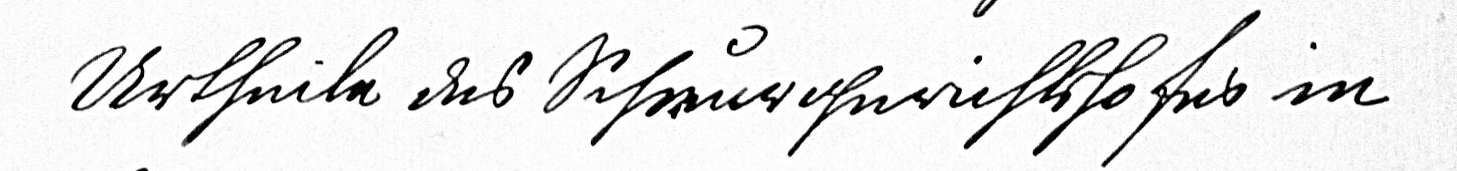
Urtheile des Schwurgerichtshofes in
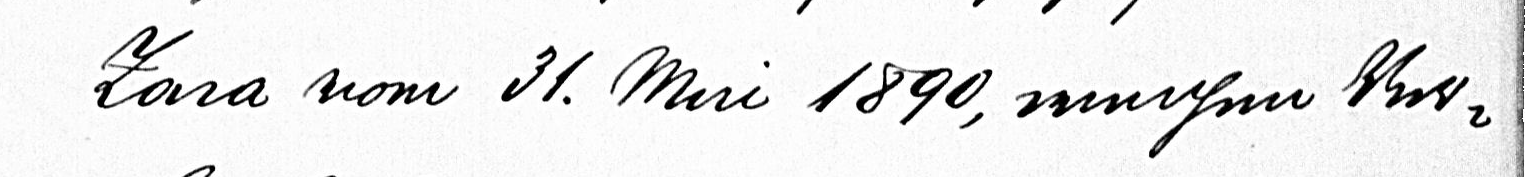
Zara vom 31. Mai 1890, wegen Ver¬
